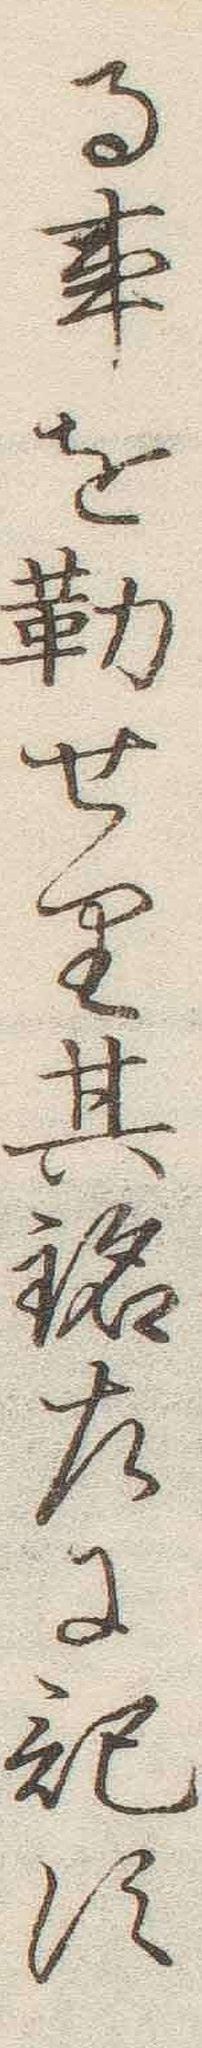る事を勒せり其銘左に記す
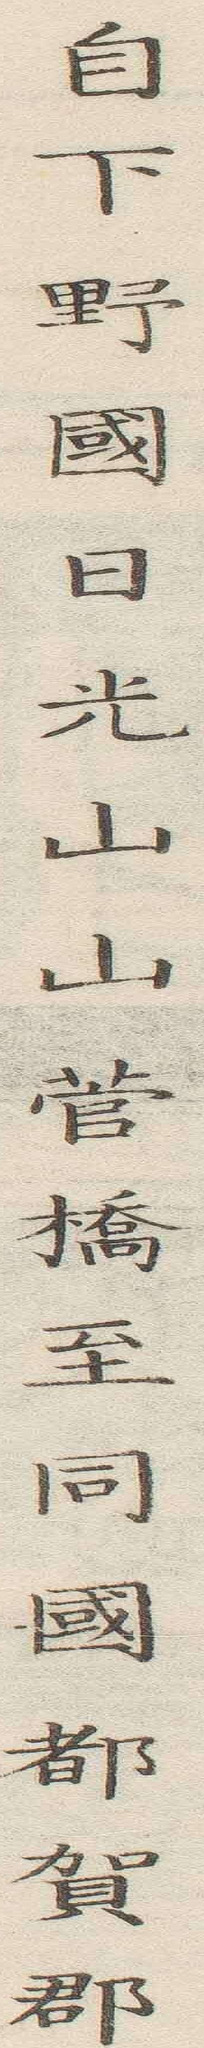自下野國日光山山菅橋至同國都賀郡
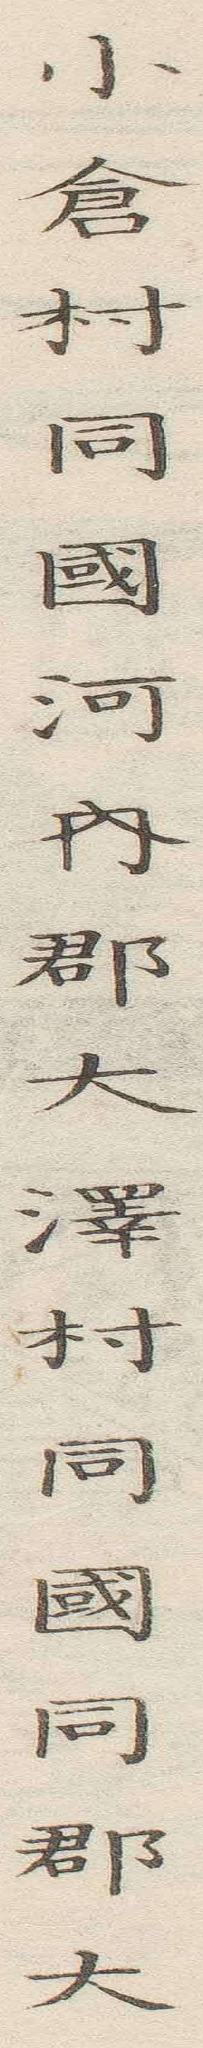小倉村同國河内郡大澤村同國同郡大
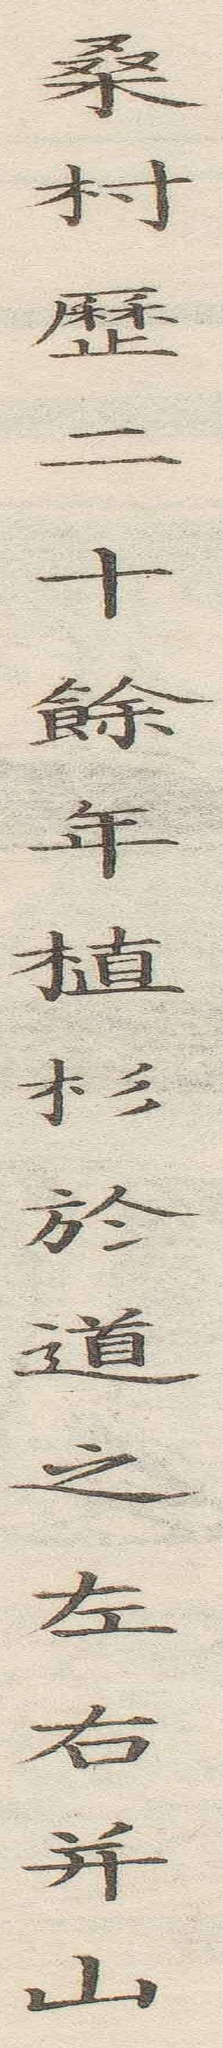桑村歷二十餘年植杉於道之左右并山
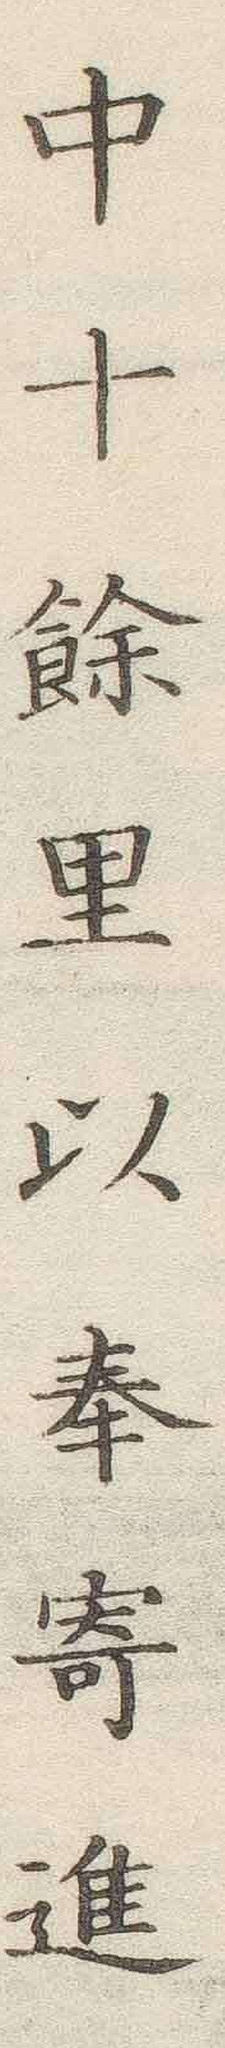中十餘里以奉寄進
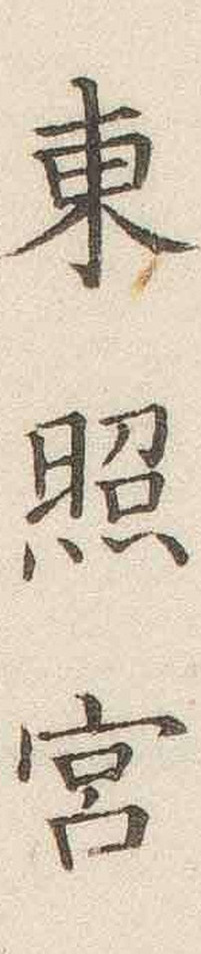東照宮
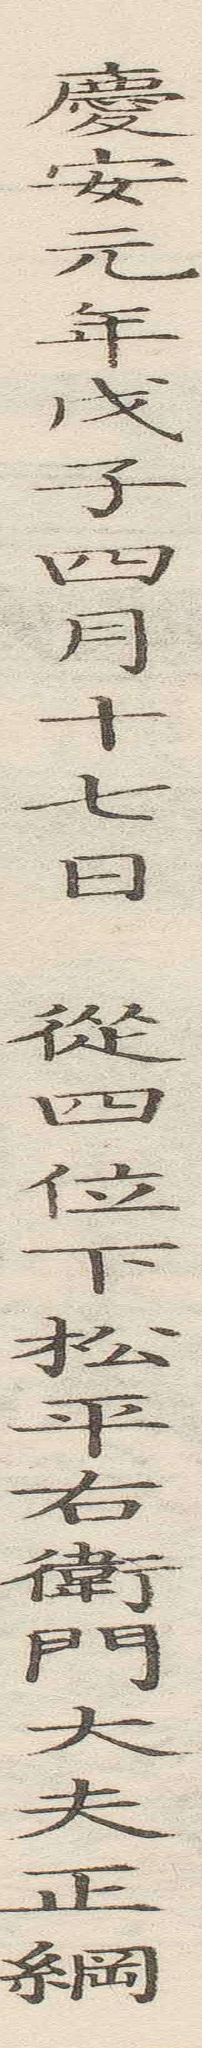慶安元年戊子四月十七日從四位下松右衛門大夫正綱
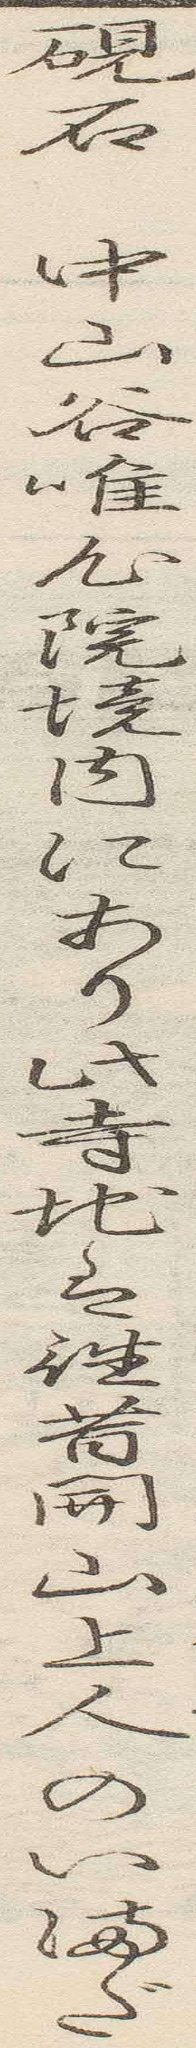硯石中山谷唯心院境内にあり此寺地は徃昔開山上人のいまだ
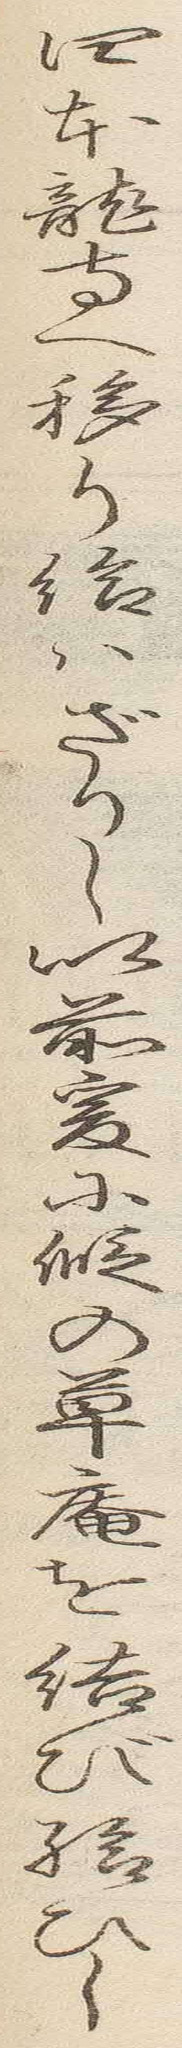四本龍寺へ移り給はざりし以前爰に假の草庵を結び給ひし
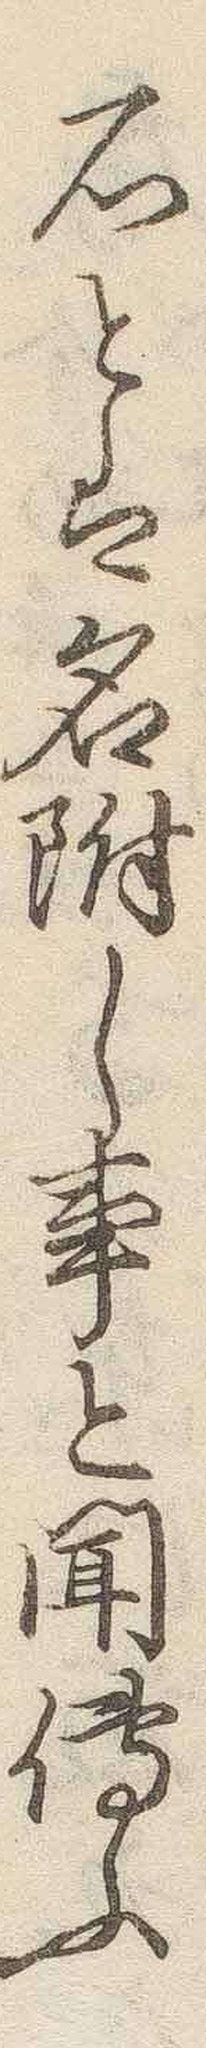石とは名附し事と聞傳ふ
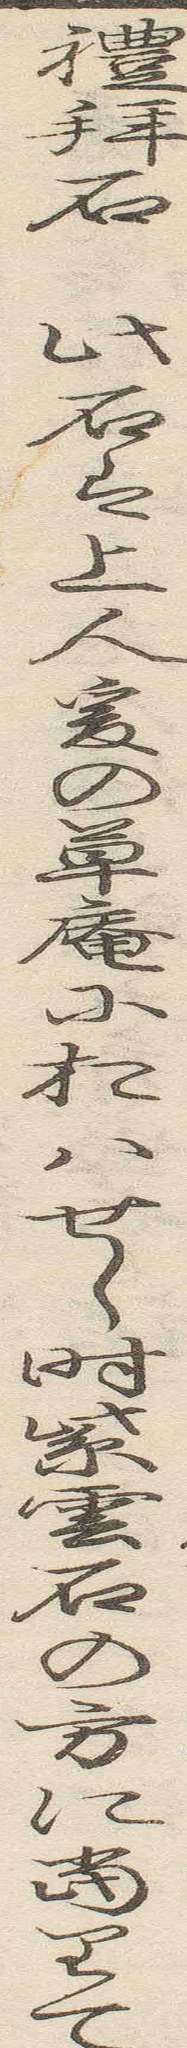禮拜石此石は上人爰の草庵におはせし时紫雲石の方に當りて
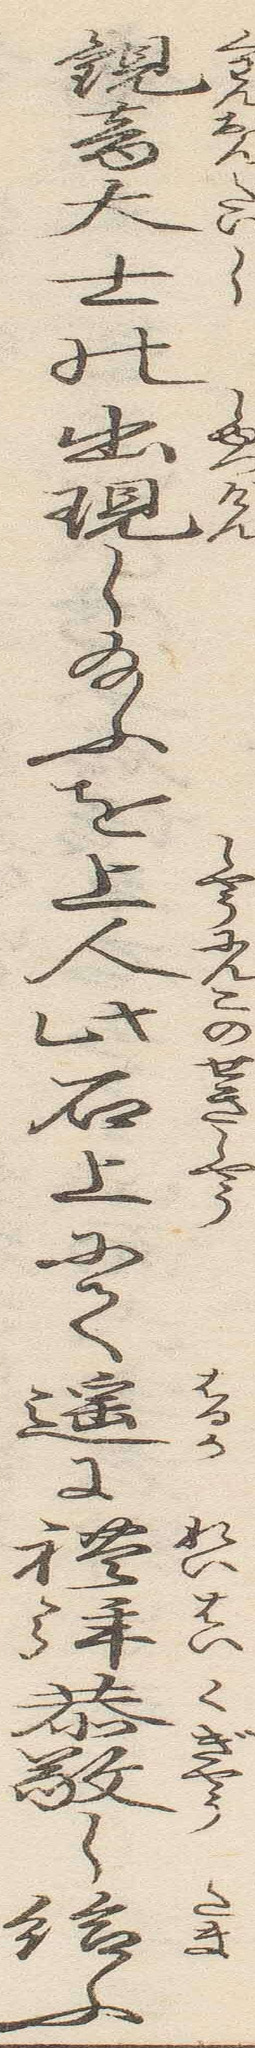觀音大士の出現し給ふを上人此石上にて遥に禮拜恭敬し給ふ
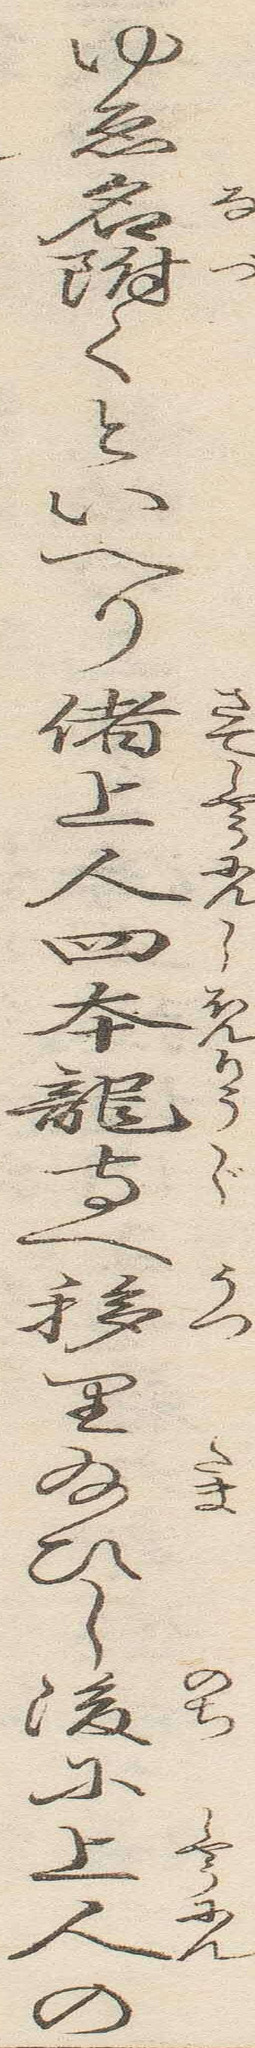ゆゑ名附くといへり偖上人四本龍寺へ移り給ひし後に上人の
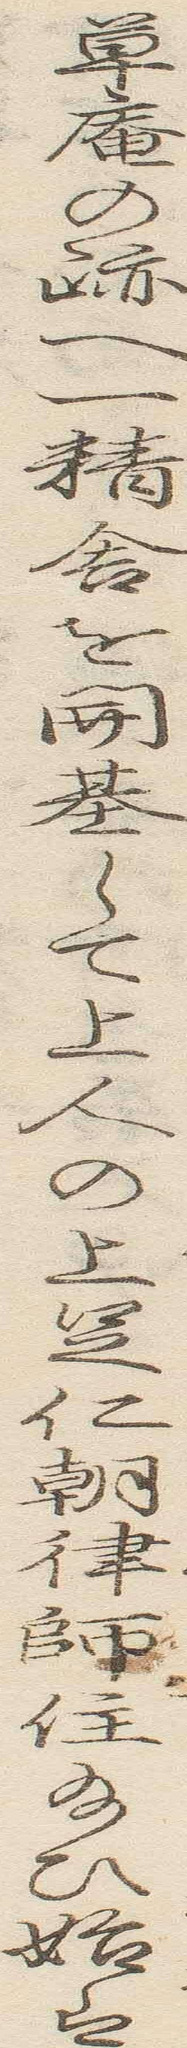草庵の跡へ一精舎を開基して上人の上足仁朝律師住給ひ始は
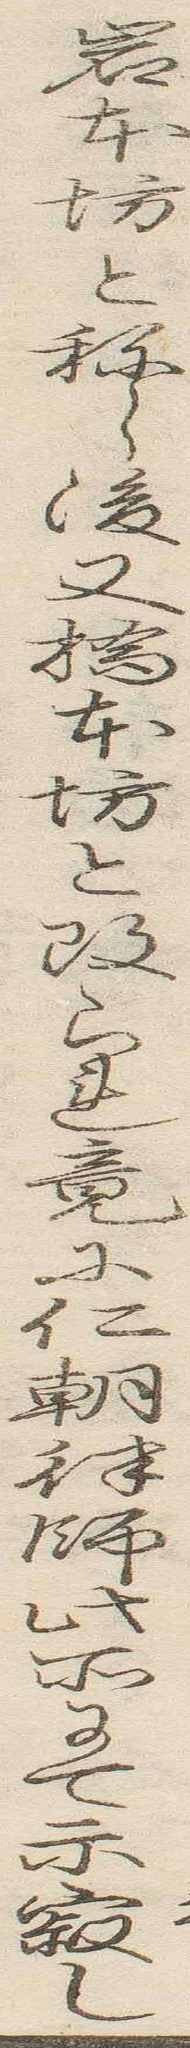岩本坊と称し後又橋本坊と改られ竟に仁朝律師此所にて示寂し
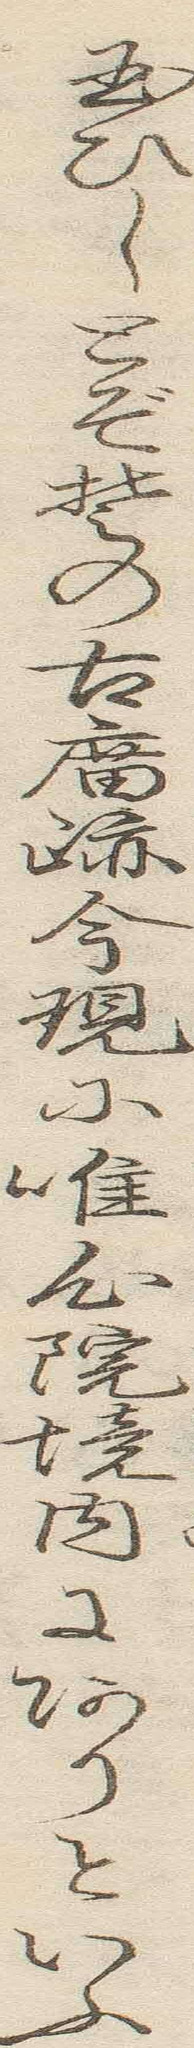玉ひしとぞその古庿跡今現に唯心院境内にありといふ
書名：日光山志
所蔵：東京学芸大学附属図書館 国文学研究資料館
